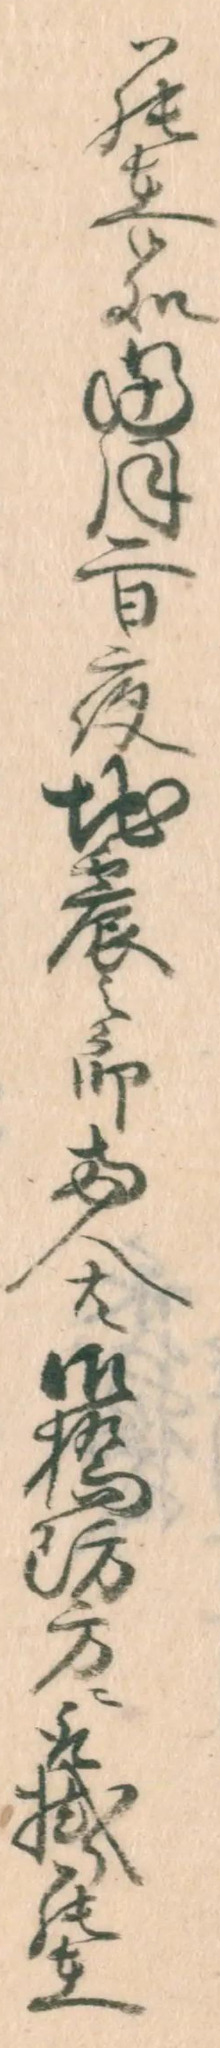罷在候処当月二日夜地震之節両人共御橋防方ニ取掛リ罷在
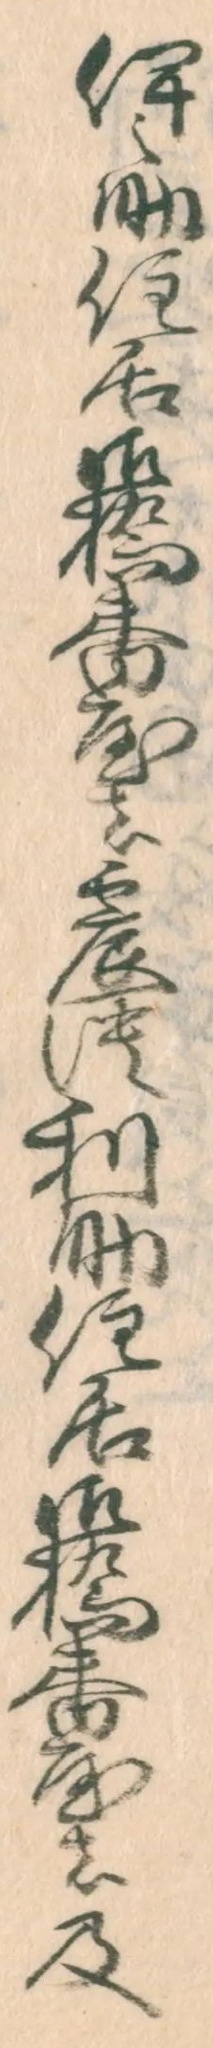伊之助住居御橋番屋は震潰利助住居御橋番屋は及
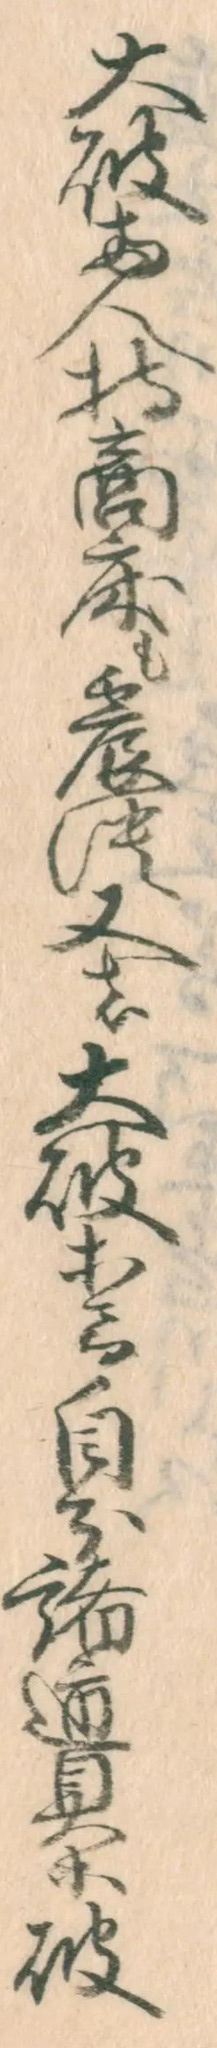大破両人持商床も震潰又は大破等ニ而自分諸道具等破

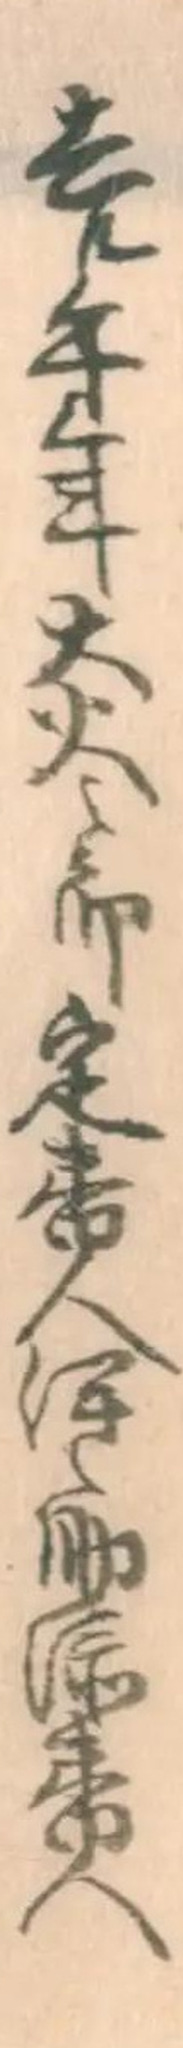去ル午年大火之節定番人伊之助添番人
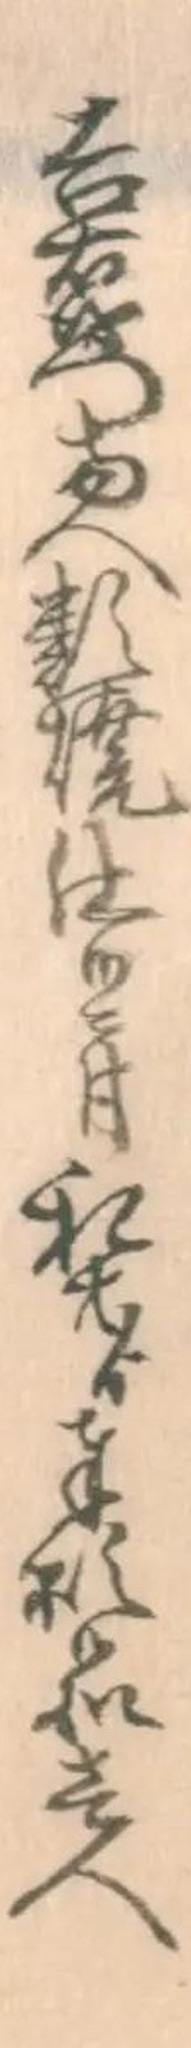吉右衛門両人類焼仕候ニ付私共ゟ奉願候処壱人
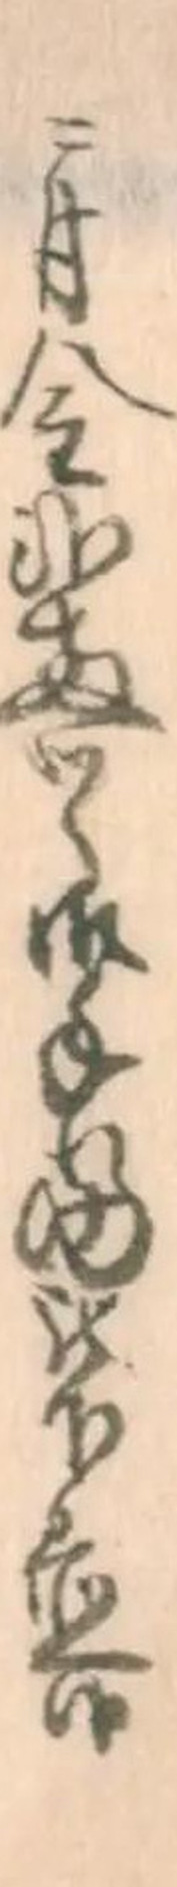ニ付金弐両ツゝ御手当被下置候

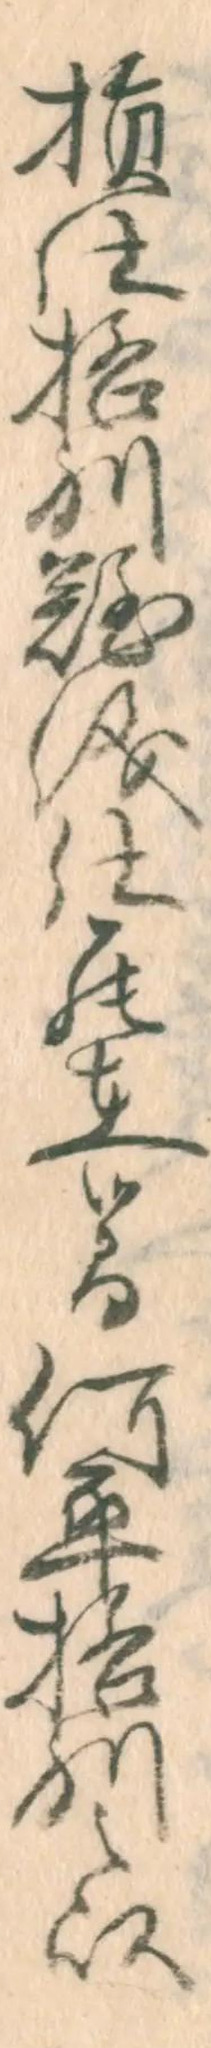損仕格別難儀仕罷在候間何卒格別之以
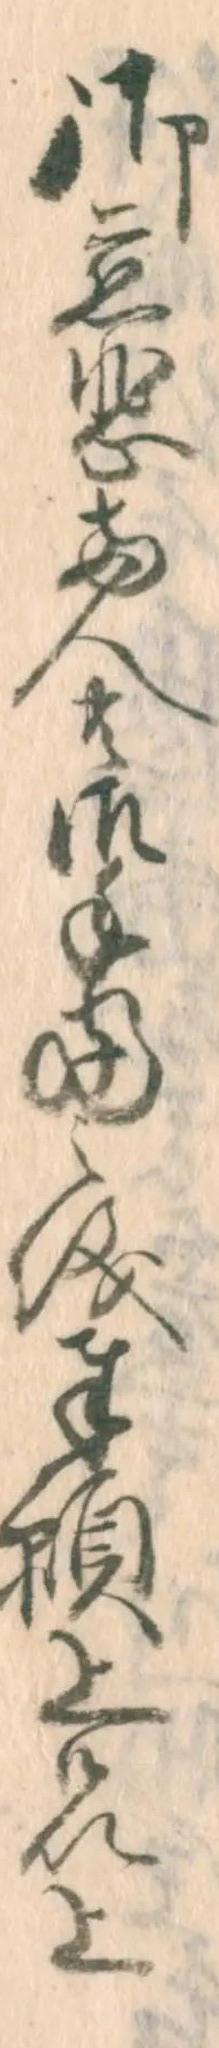御慈悲両人共御手当之儀奉願上候以上
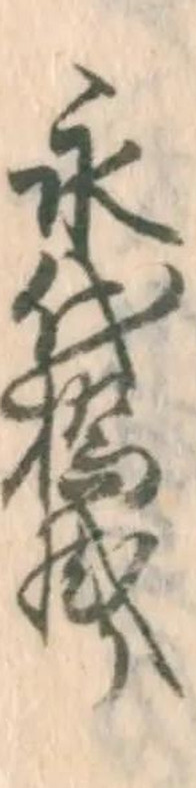永代橋掛リ
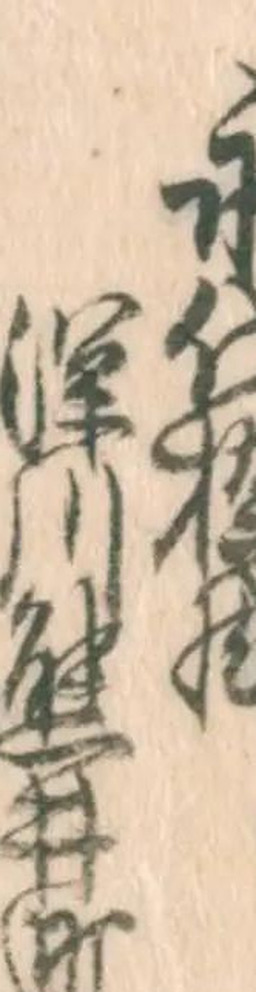深川熊井町
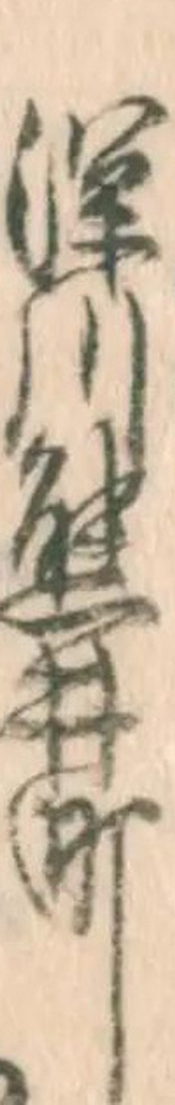深川熊井町
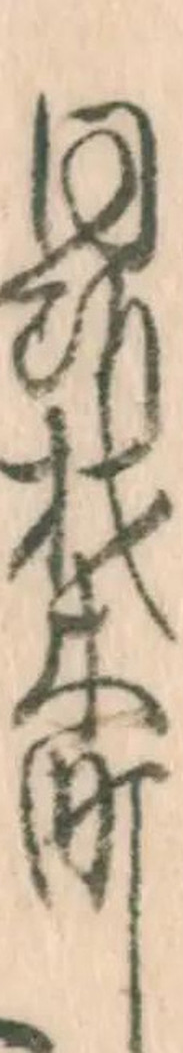同所材木町
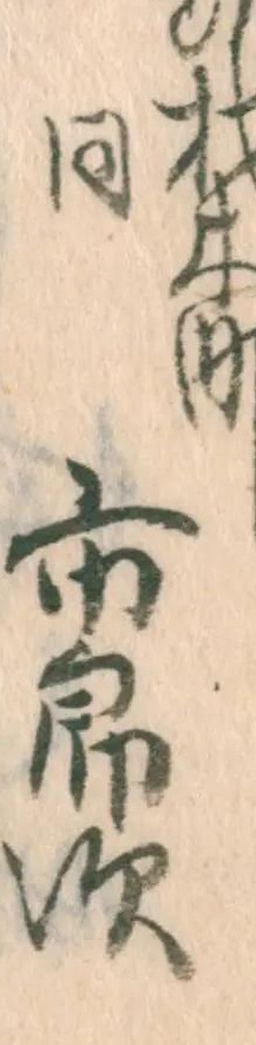同市郎次
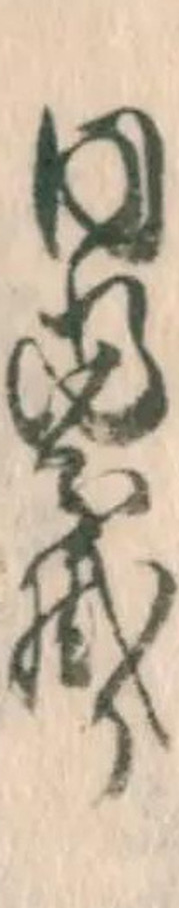同当分掛リ
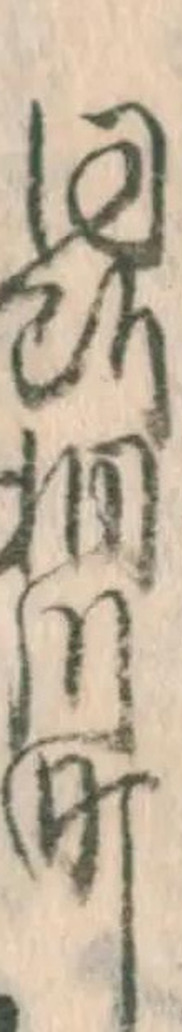同所相川町
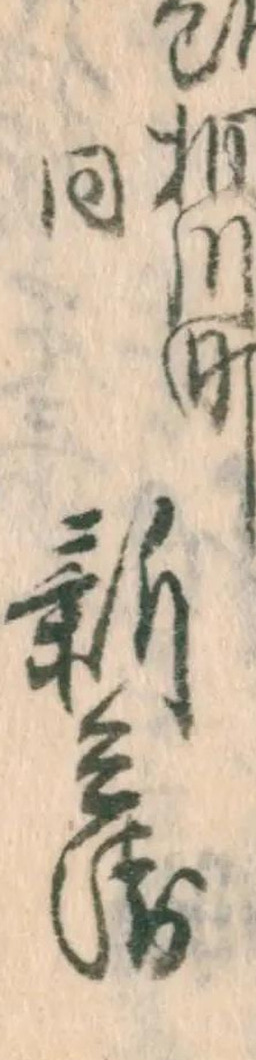同新兵衛
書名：地震災書留 2巻. [1] 内表紙に「地震災書留　安政二卯年　但本所深川御用屋敷地代免除調」とあり
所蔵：国立国会図書館 National Diet Library, JAPAN
